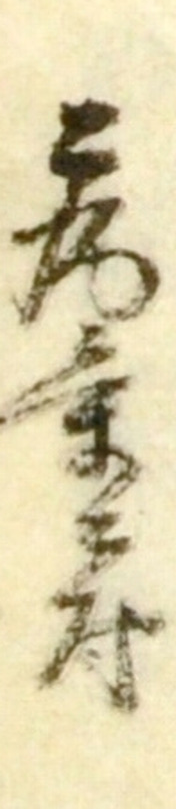病気ニ付
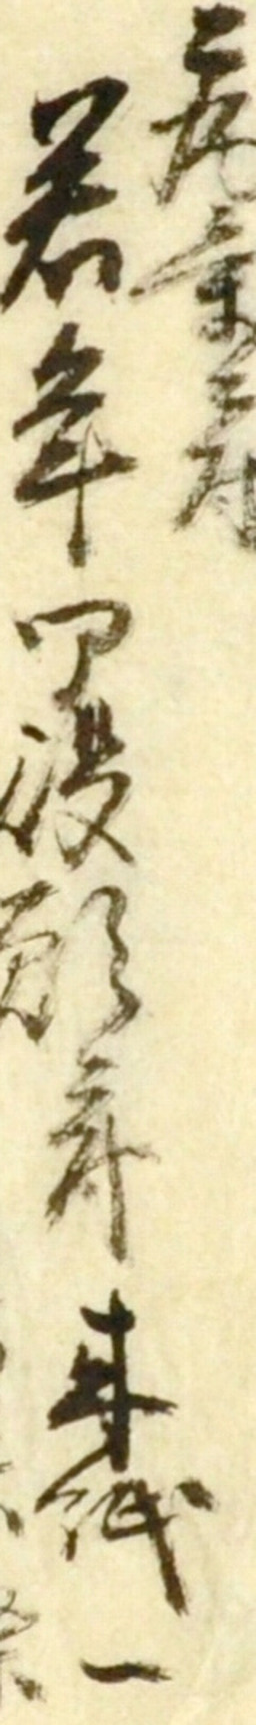若年御役願ニ付来紙一
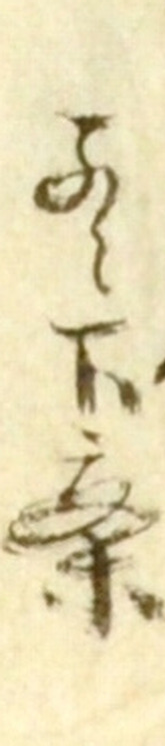早々下案
